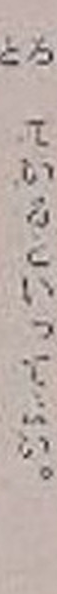ているといってよい。
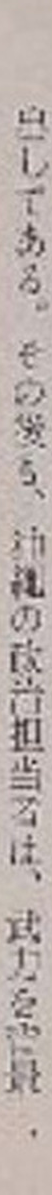してある。その後も、沖縄の政治担当者は、武力を背景
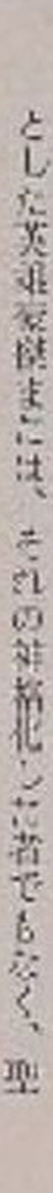とした英雄豪傑または、それの神格化した者でもなく、聖
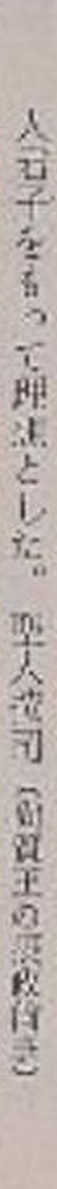人君子をもって理想とした。聖人按司(尚質王の摂政尚享)
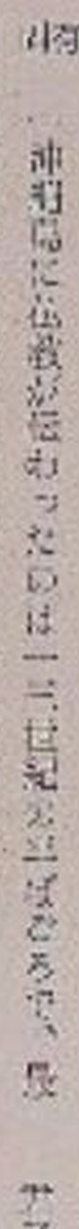沖縄島に仏教が伝わったのは一三世紀の半ばごろで、最
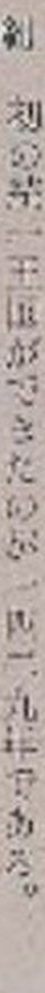初の統一王国ができたのが一四二九年である。
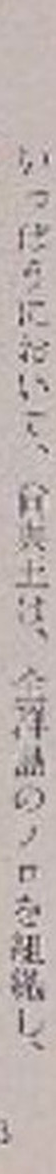いっぽうにおいて、尚真王は、全群島のノロを組織し、
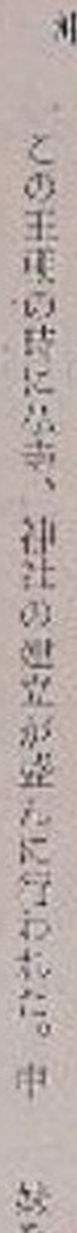この王朝の時に仏寺、神社の建立が盛んに行われた。中
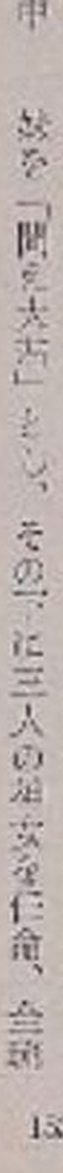妹を「聞え大君」とし、その下に三人の神女を任命、全琉

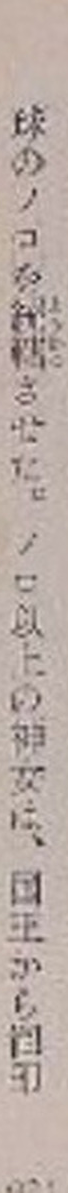球のノロを統轄させた。ノロ以上の神女は、国王から御印
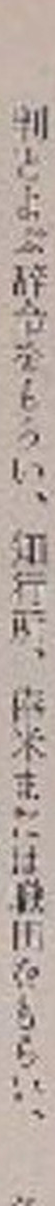判とよぶ辞令をもらい、知行所、俸米または嶽田をもらい、
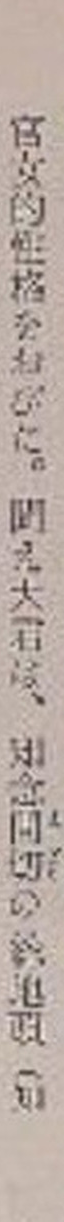官女的性格をおびた。聞え大君は、知念間切の総地頭(知
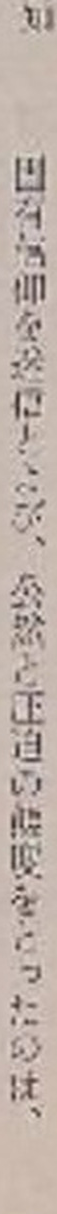固有信仰を迷信とよび、公然と圧迫の態度をとったのは、
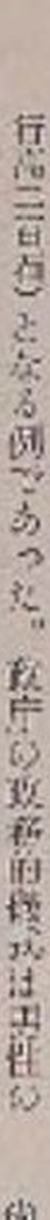行高二百石)となる例であった。政庁の政務的は男性の
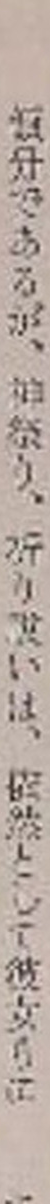領分であるが、神祭り、祈り祓いは、依然として彼女らに
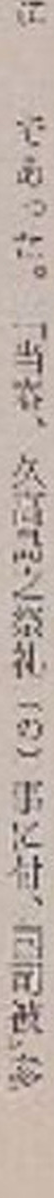であった。「当春、久高島之祭礼(の)事に付、国司被参
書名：沖縄固有信仰のおとろえ
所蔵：University of the Ryukyus Library
